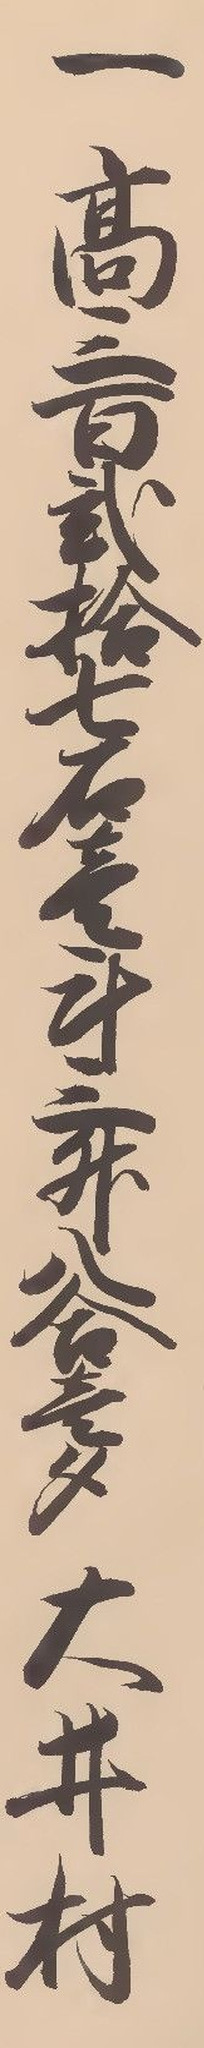一高三百弐拾七石壱斗三升八合壱勺大井村
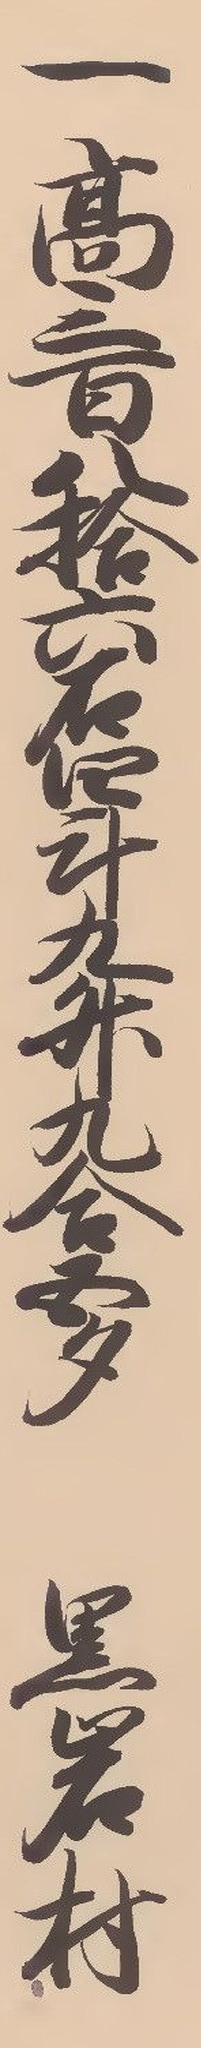一高三百八拾六石四斗九升九合五勺黒岩村
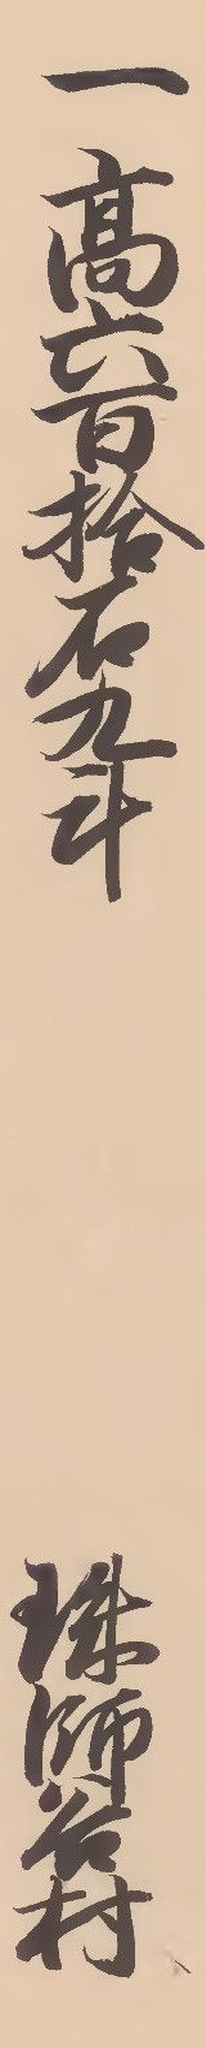一高六百拾石九斗珠師谷村
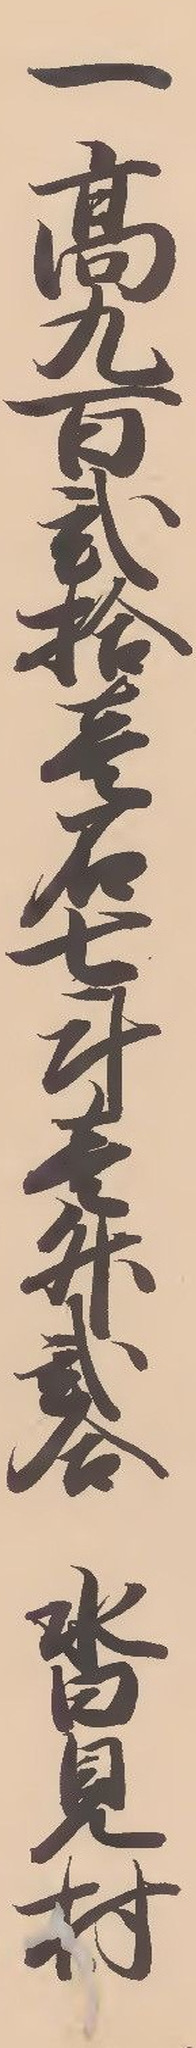一高九百弐拾壱石七斗壱升弐合沓見村

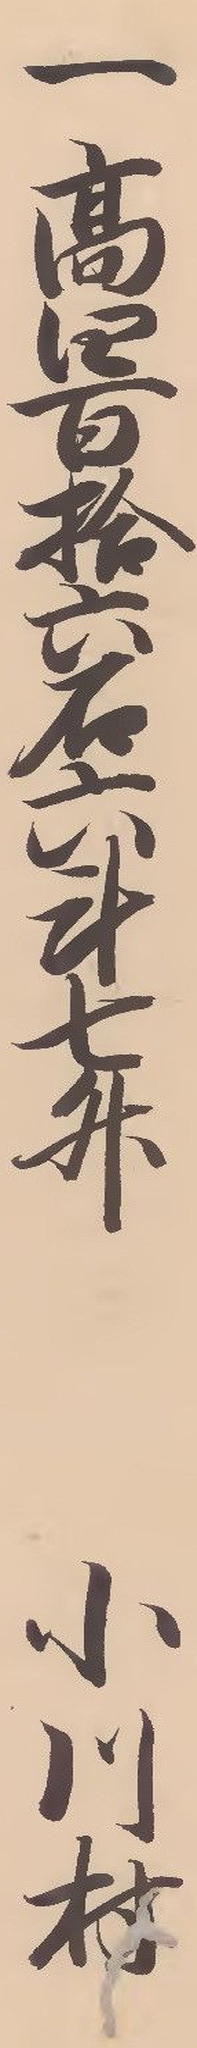一高四百拾六石六斗七升小川村
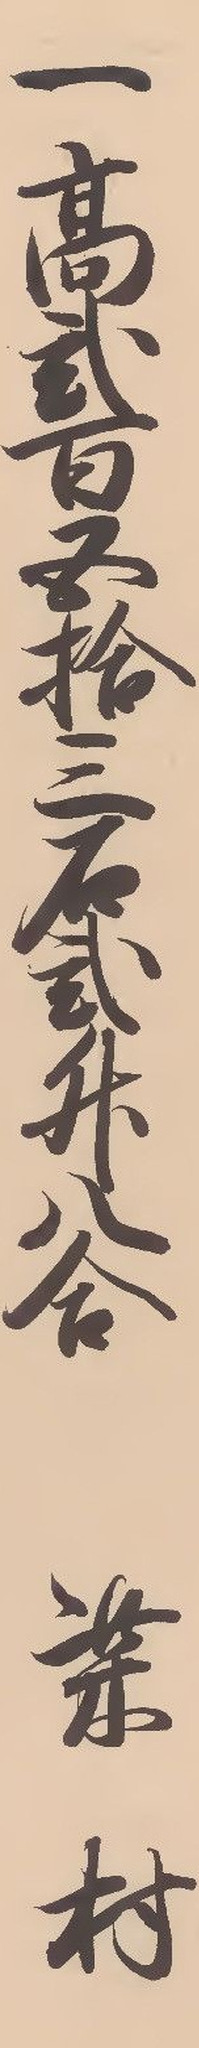一高弐百五拾三石弐升八合柴村
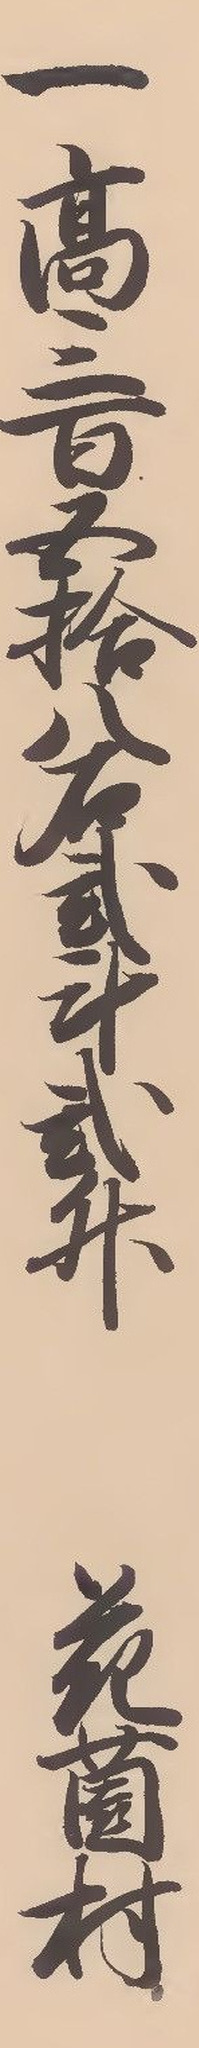一高三百五拾八石弐斗弐升花園村
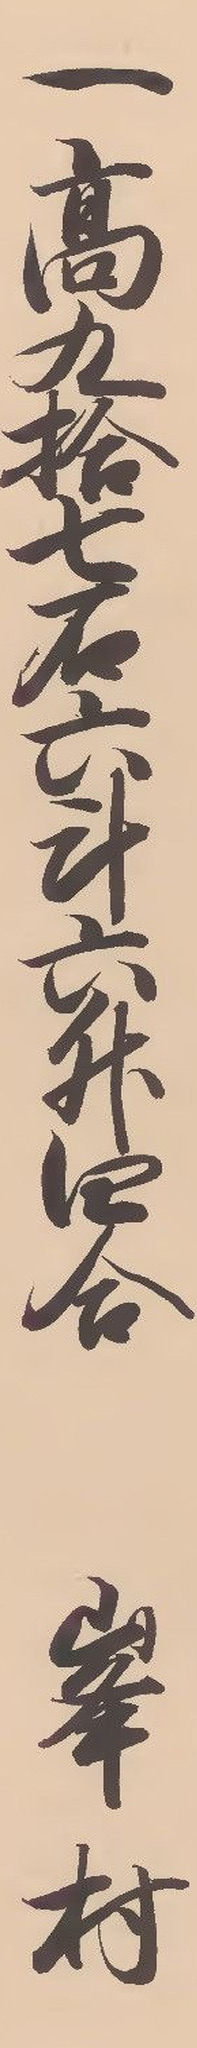一高九拾七石六斗六升四合峰村
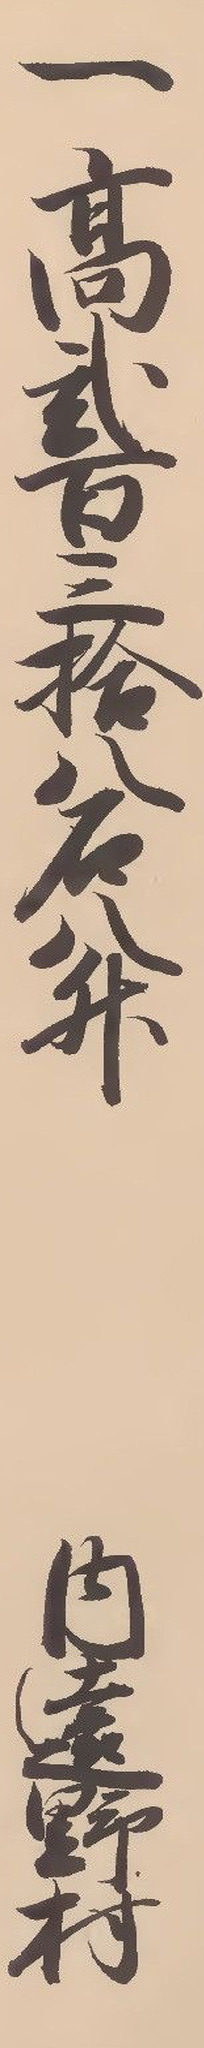一高弐百三拾八石八升内遠野村
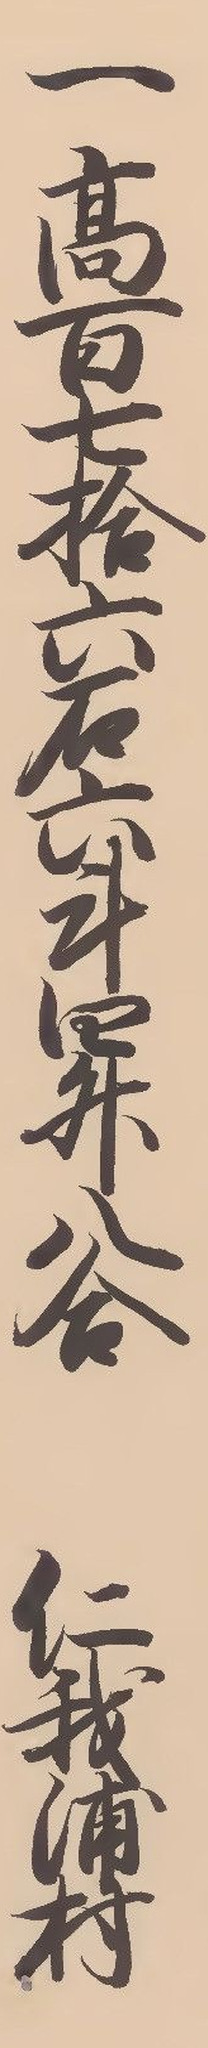一高百七拾六石六斗四升八合仁我浦村
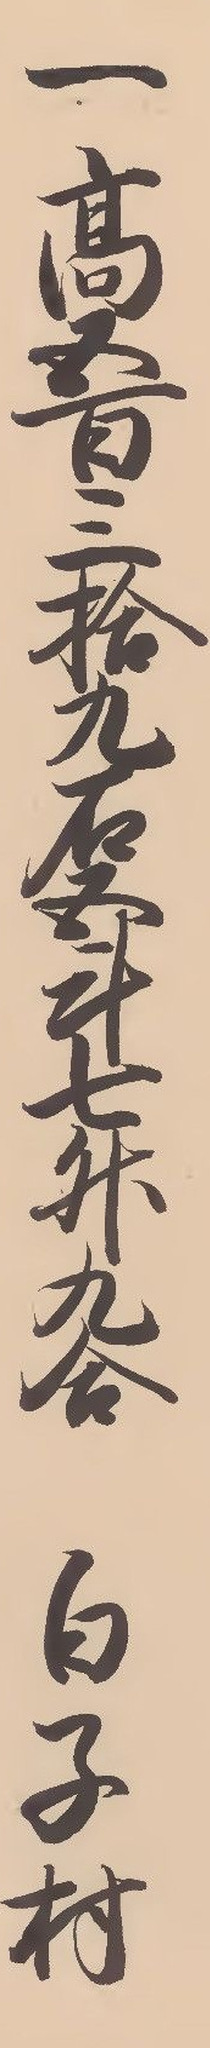一高五百三拾九石五斗七升九合白子村
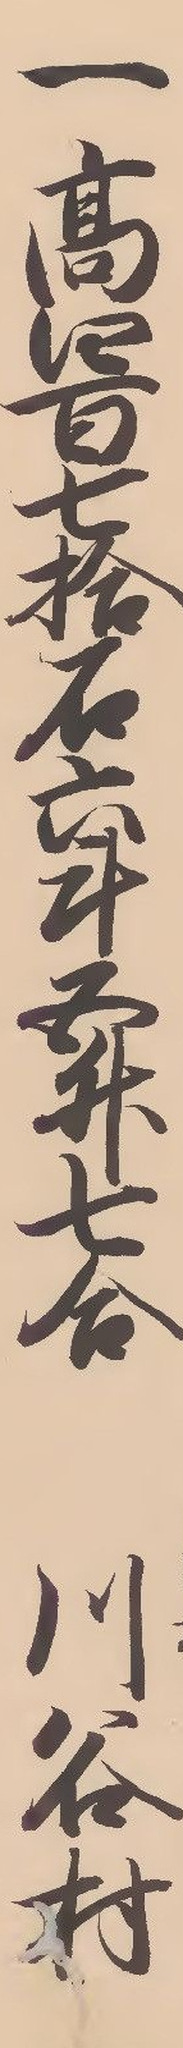一高四百七拾石六斗五升七合川谷村

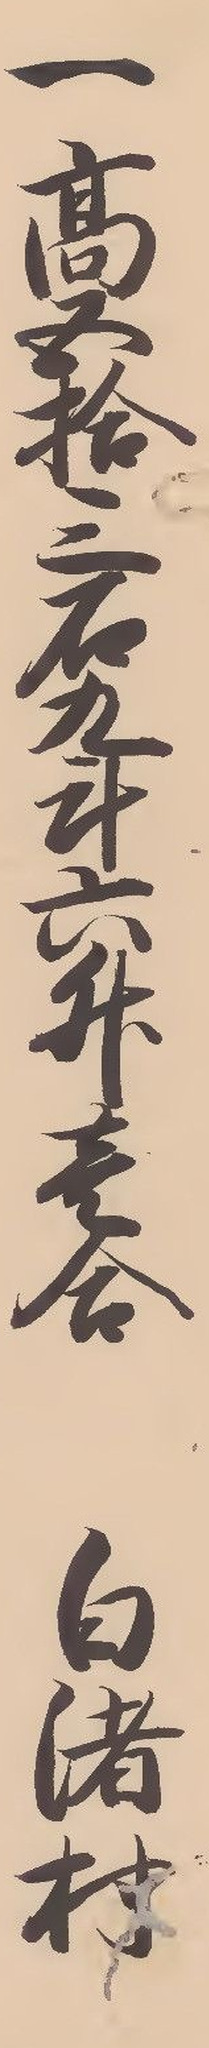一高五拾三石九斗六升壱合白渚村
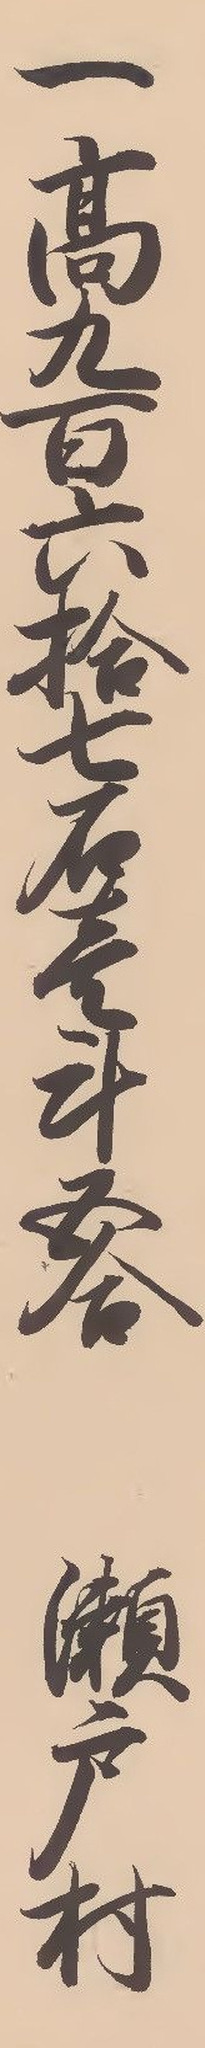一高九百六拾七石壱斗五合瀬戸村
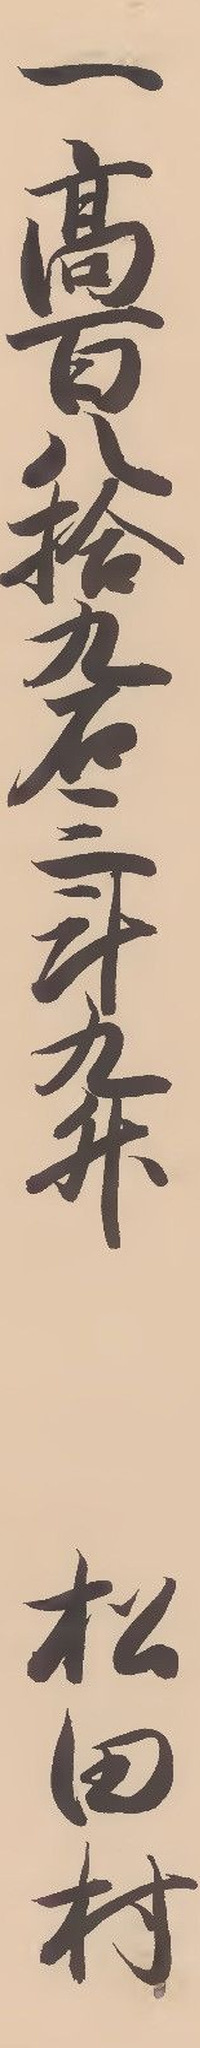一高百八拾九石三斗九升松田村
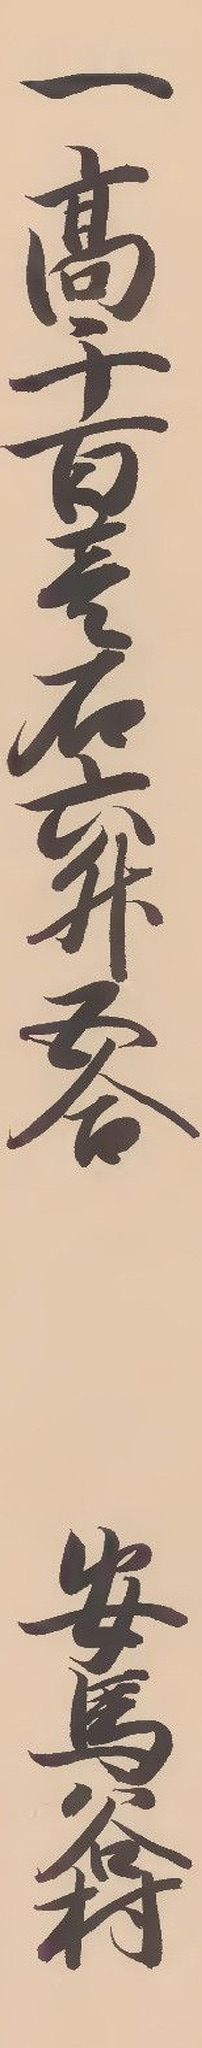一高千百壱石六升五合安馬谷村
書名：安房国郷帳
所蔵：国立公文書館 National Archives of Japan
